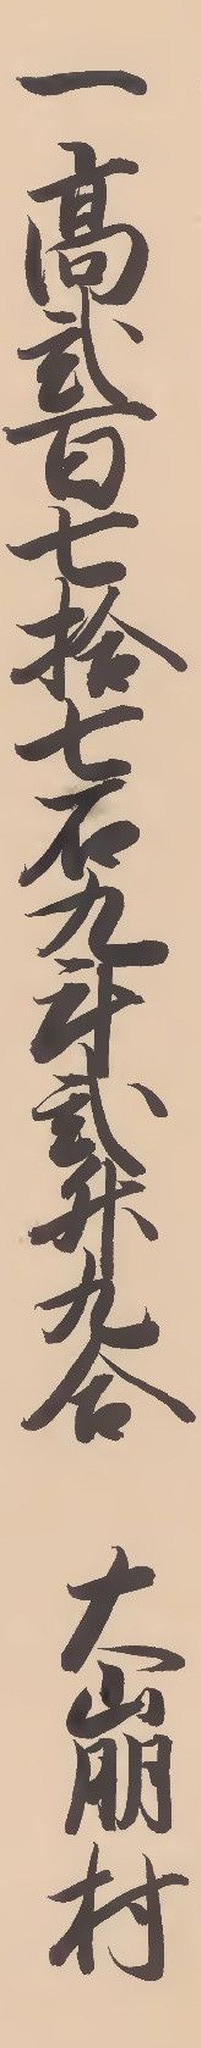一高弐百七拾七石九斗弐升九合大崩村
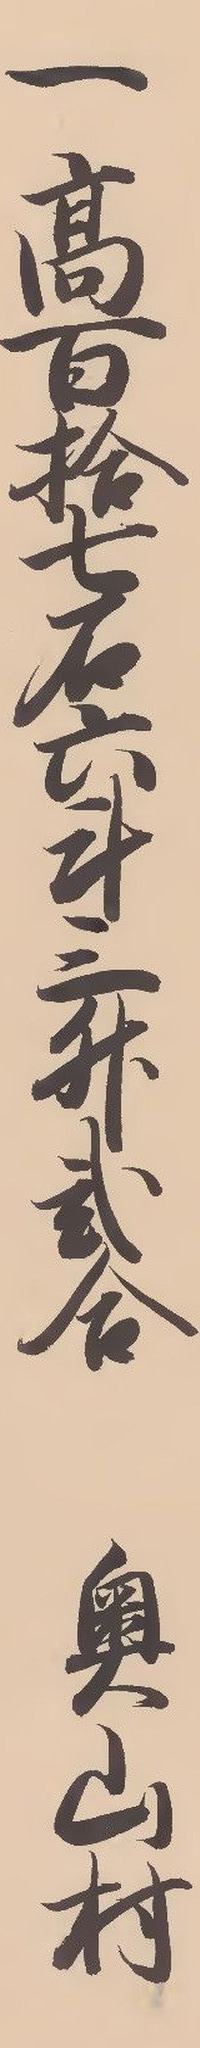一高百拾七石六斗三升弐合奥山村
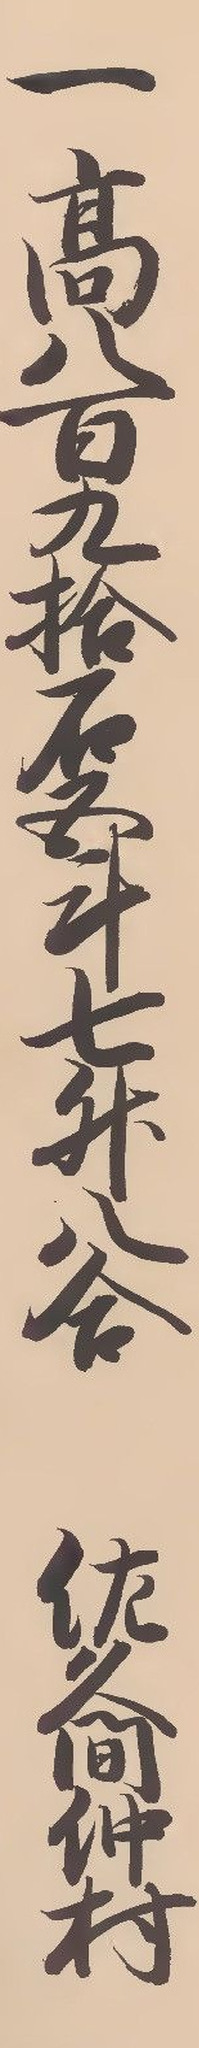一高八百九拾石五斗七升八合佐久間仲村
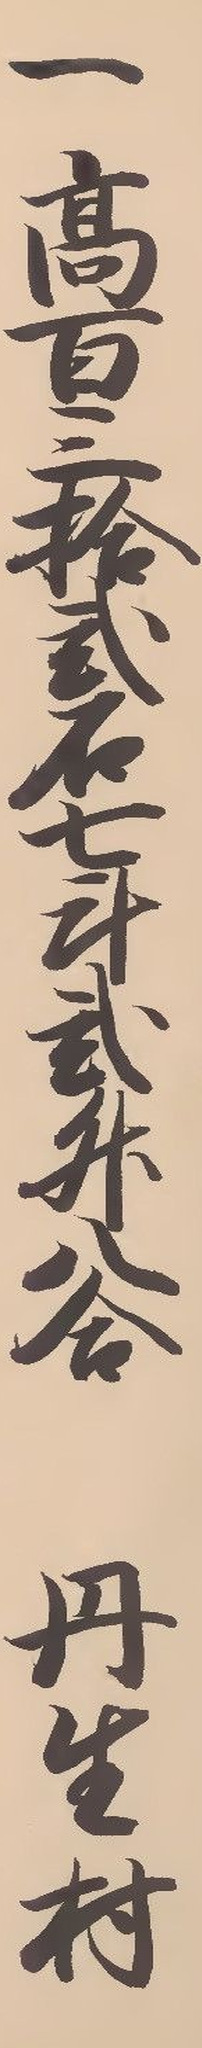一高百三拾弐石七斗弐升八合丹生村
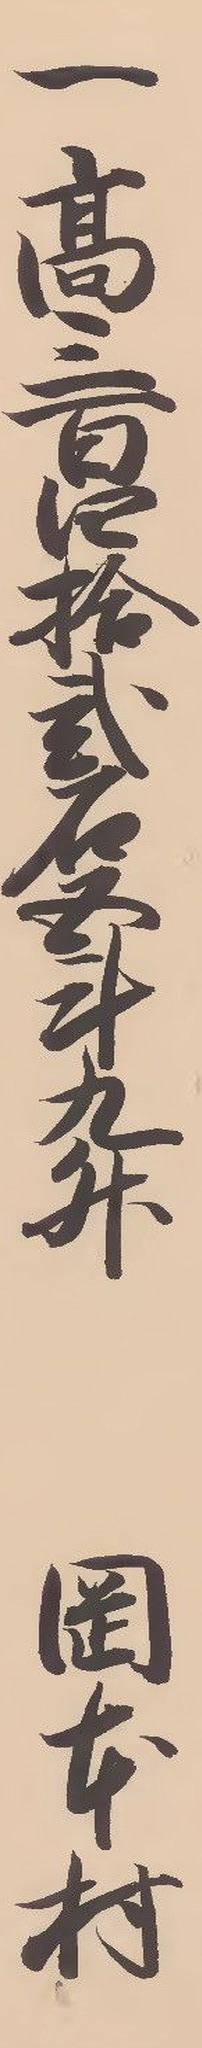一高三百四拾弐石五斗九升岡本村
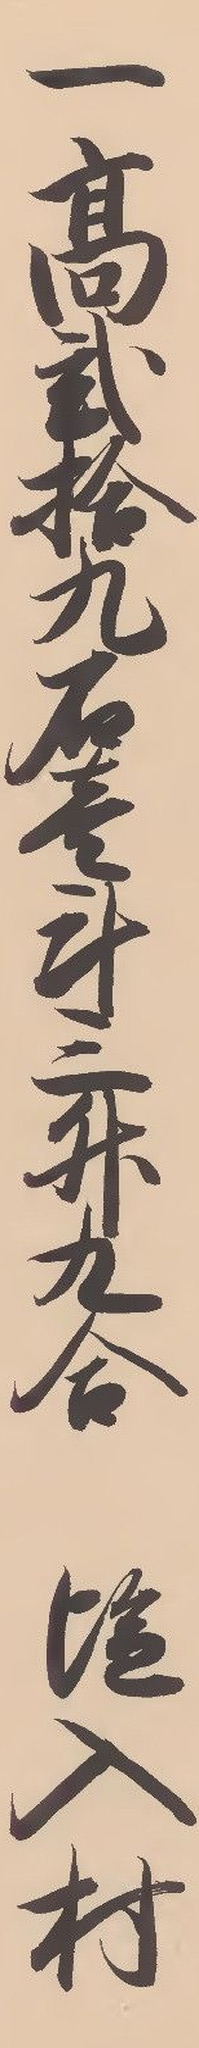一高弐拾九石壱斗三升九合塩入村
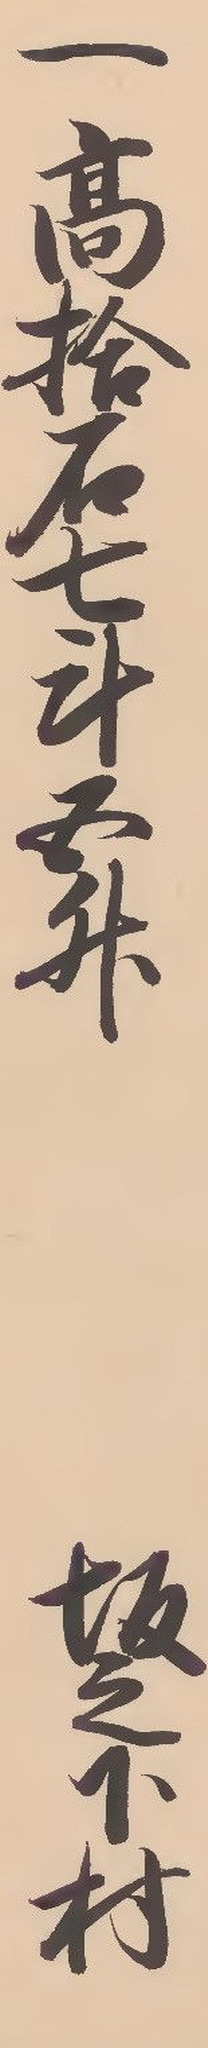一高拾石七斗五升坂之下村

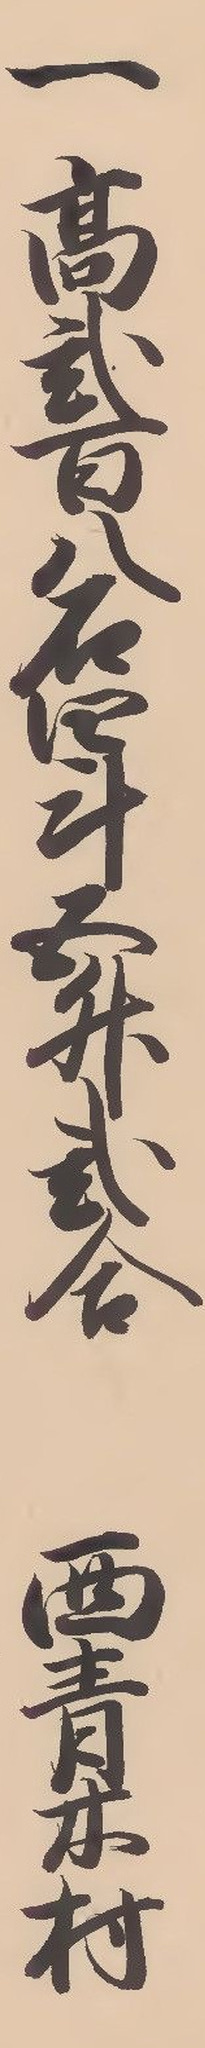一高弐百八石四斗五升弐合西青木村
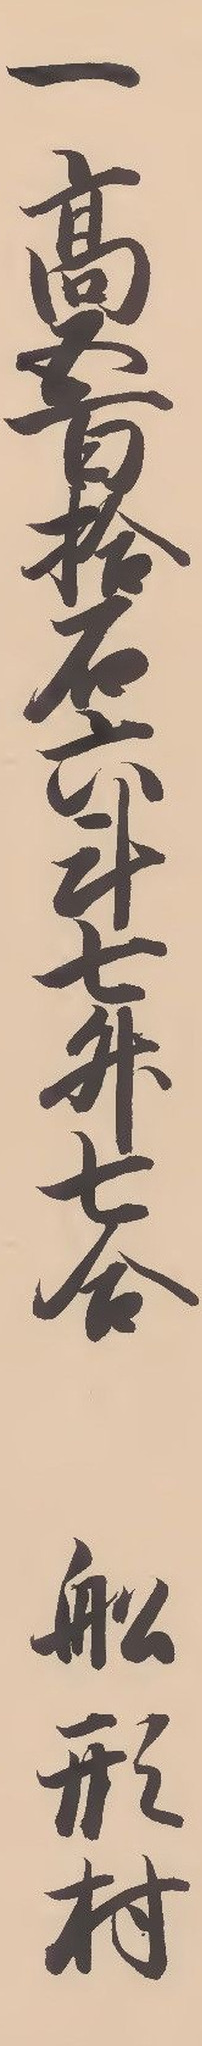一高五百拾石六斗七升七合船形村
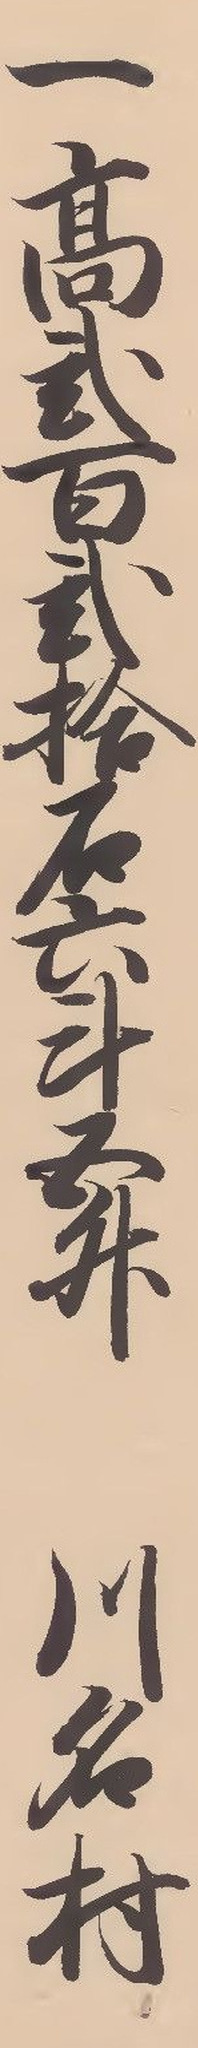一高弐百弐拾石六斗五升川名村
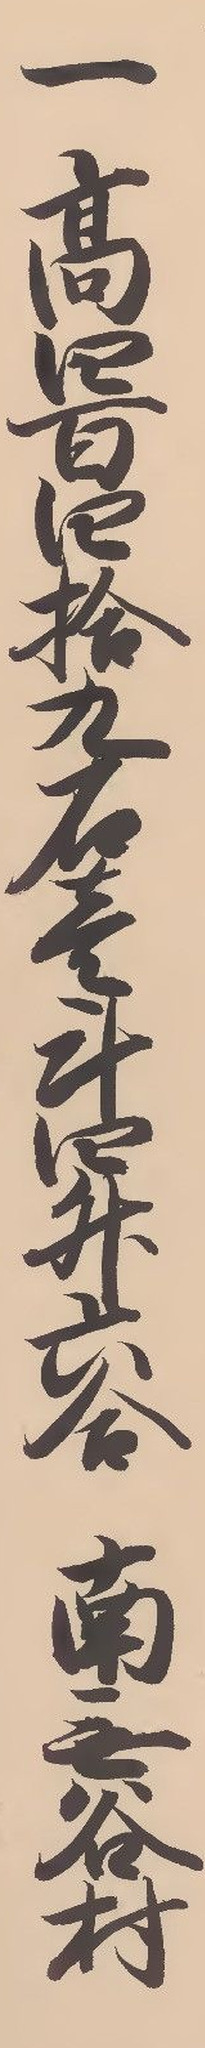一高四百四拾九石壱斗四升六合南無谷村
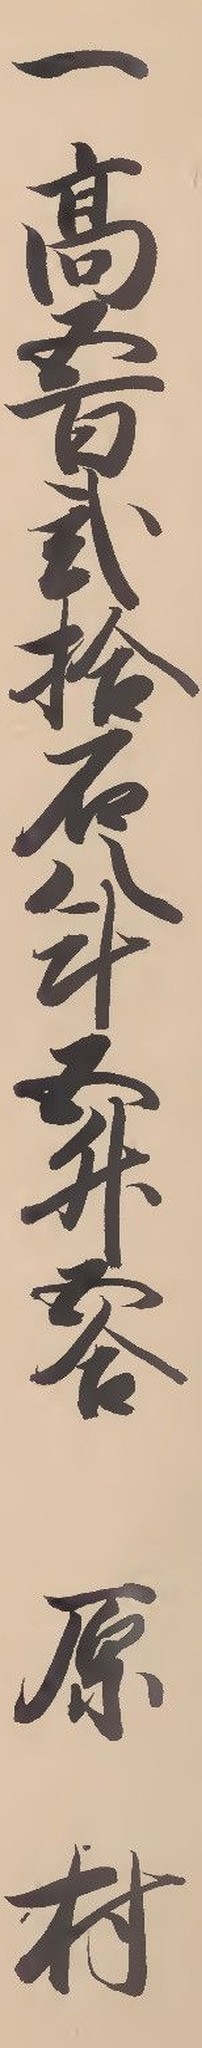一高五百弐拾石八斗五升五合原村
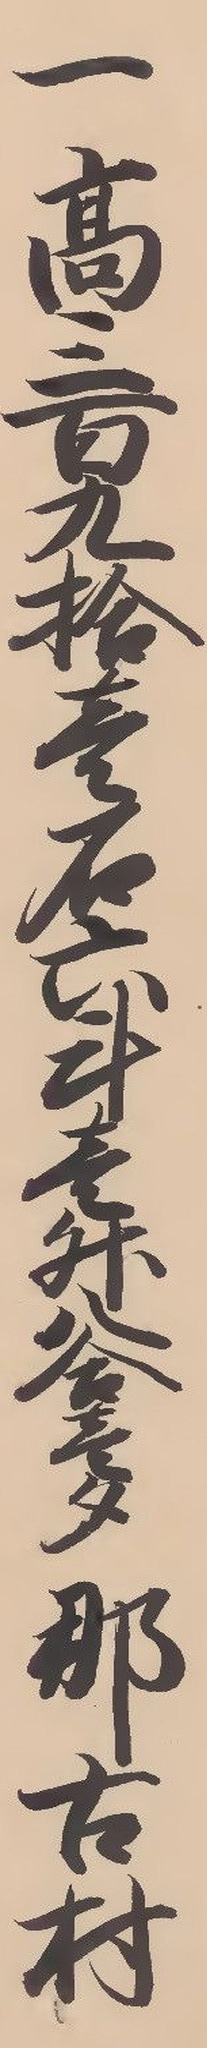一高三百九拾壱石六斗壱升八合壱勺那古村
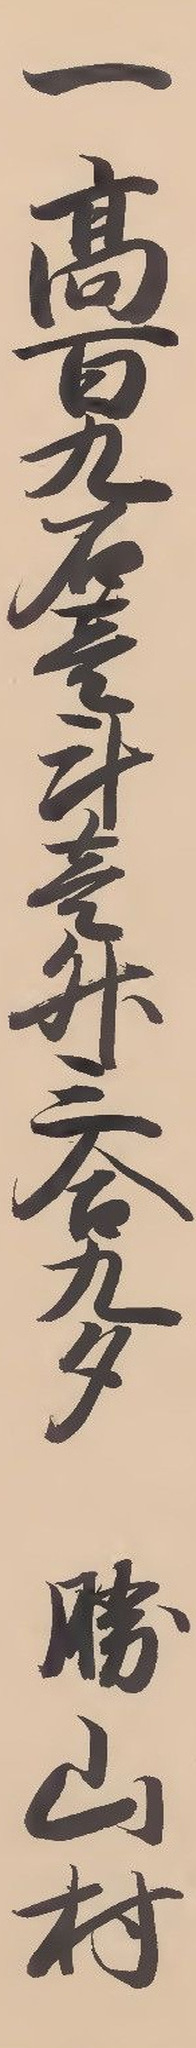一高百九石壱斗壱升三合九勺勝山村
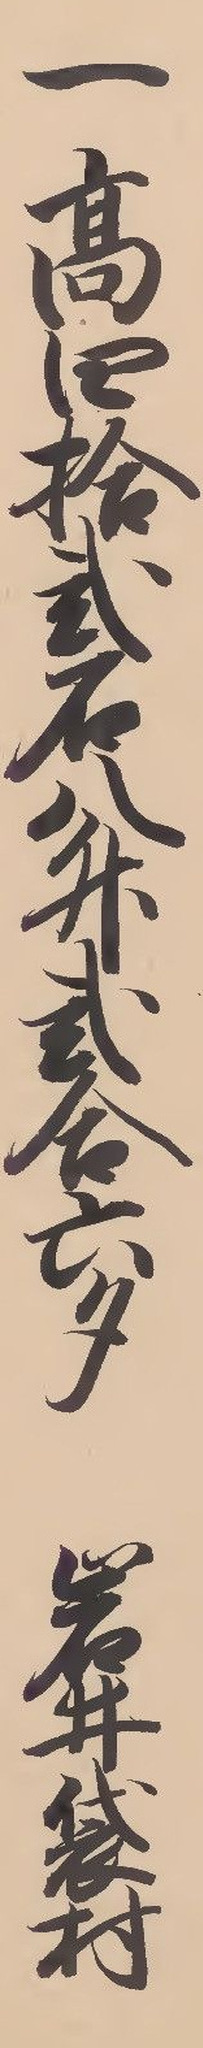一高四拾弐石八升弐合六勺岩井袋村

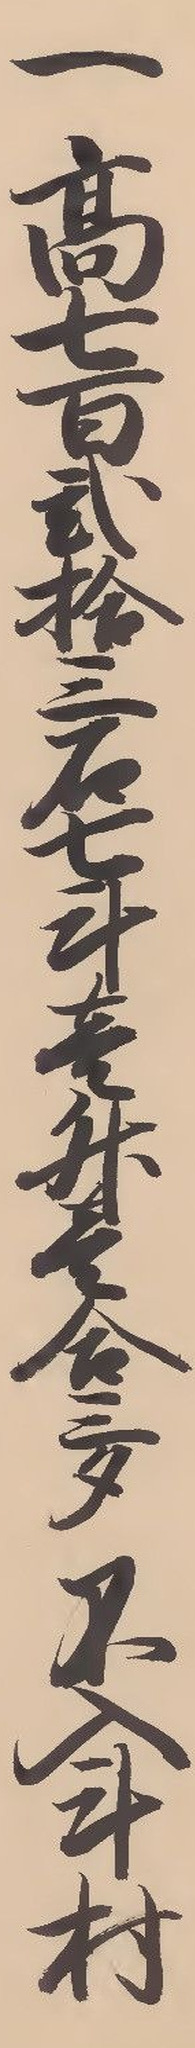一高七百弐拾三石七斗壱升壱合三勺不入斗村
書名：安房国郷帳
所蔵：国立公文書館 National Archives of Japan
